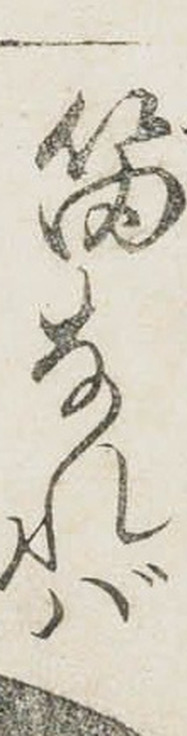笛なれば
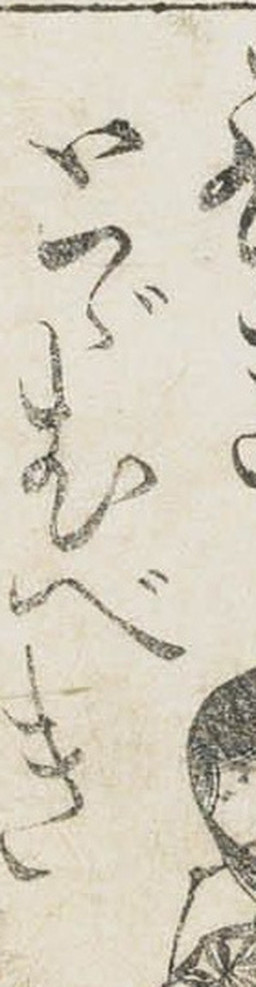とゞむべき
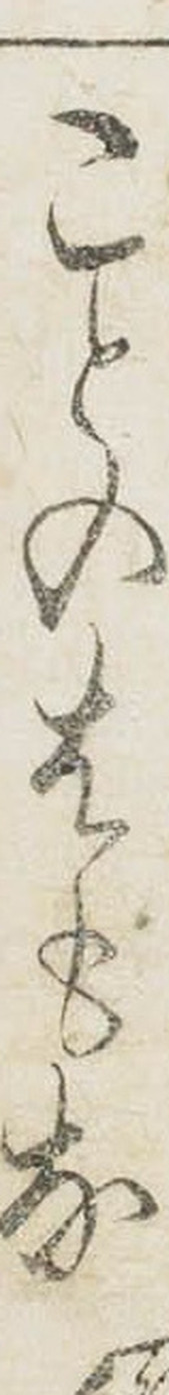ことのはもな
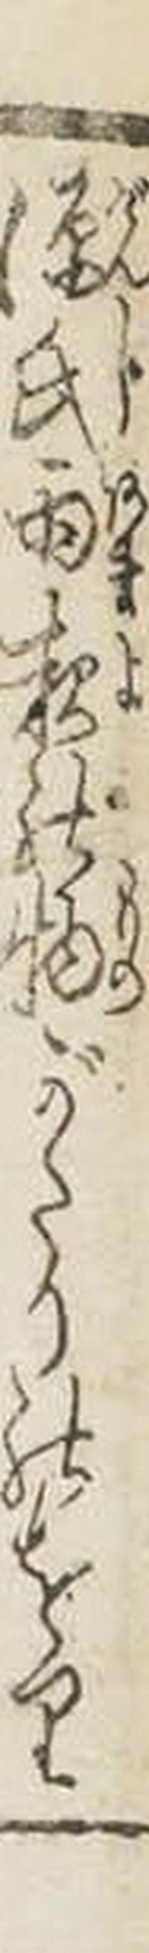源氏雨夜の物がたりのをり
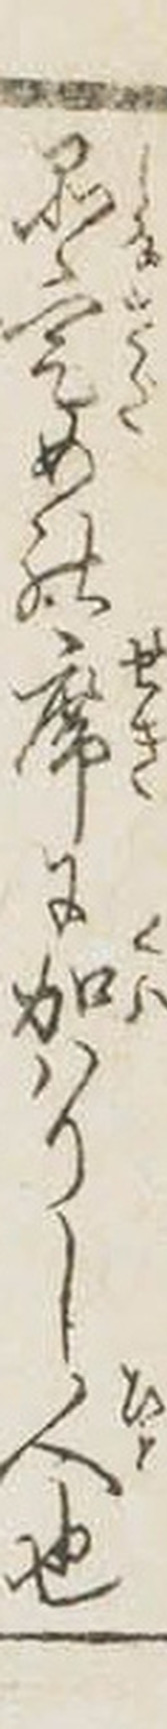品定めの席に加はりし人也
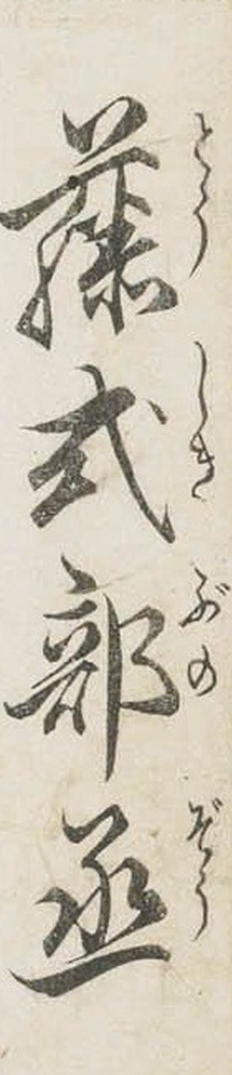藤式部丞
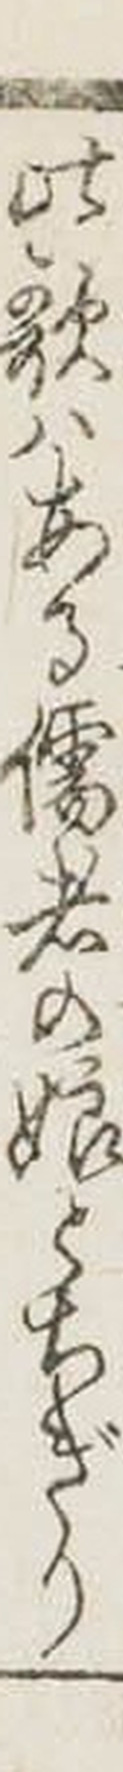此歌はある儒者の娘とちぎり
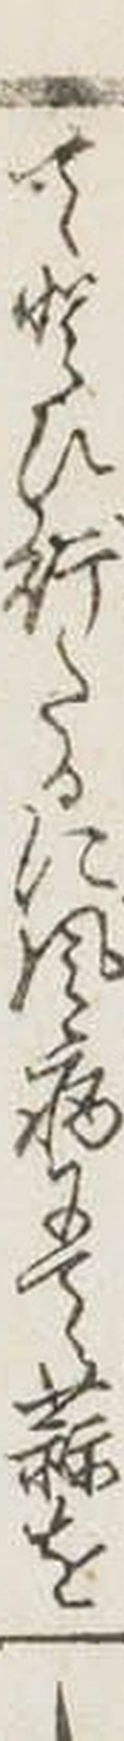てとひ行たるに風病にて蒜を
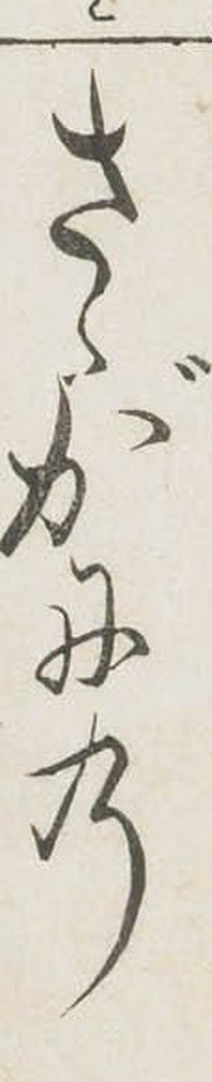さゝがにの
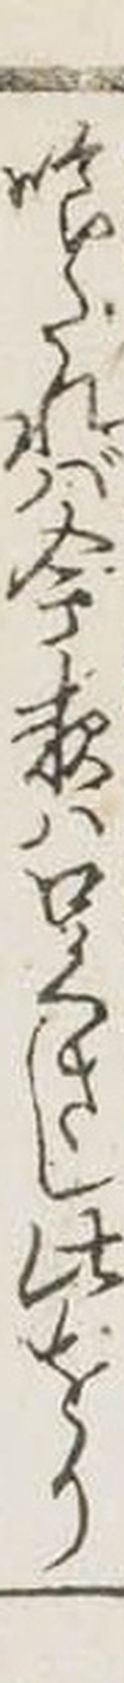喰たれば今夜は口くさし此をり
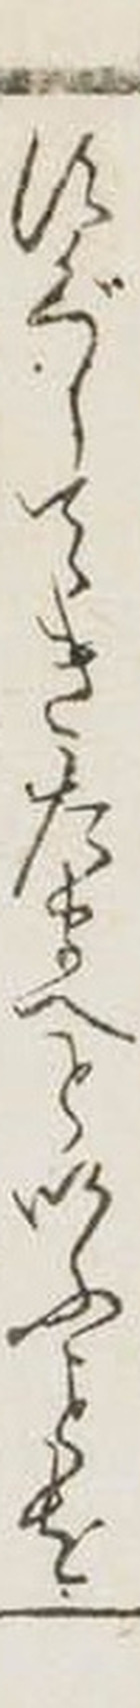すぐしてきたまへといふことを
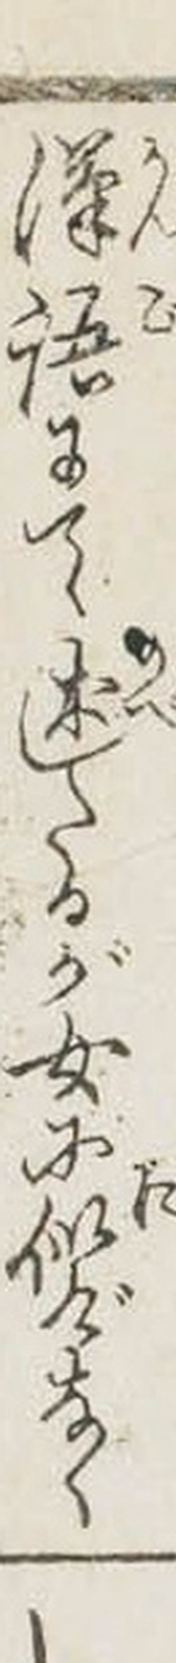漢語にて述たるが女に似げなく
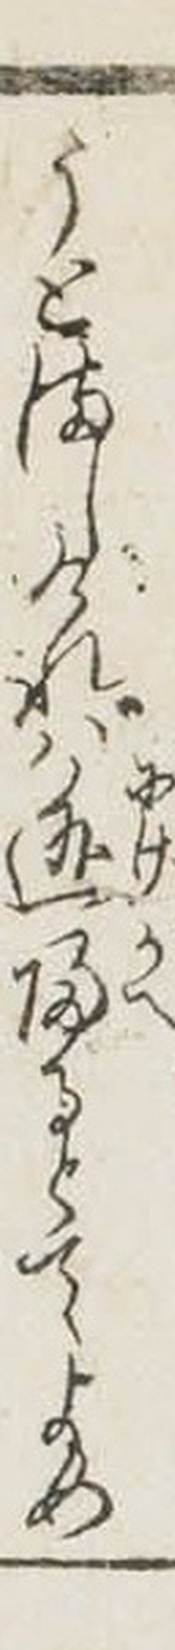うとましければ逃帰るとてよめ
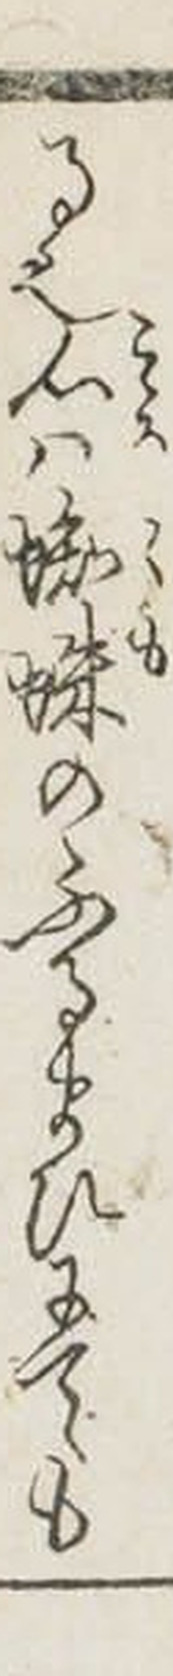る也心は蜘蛛のふるまひにても
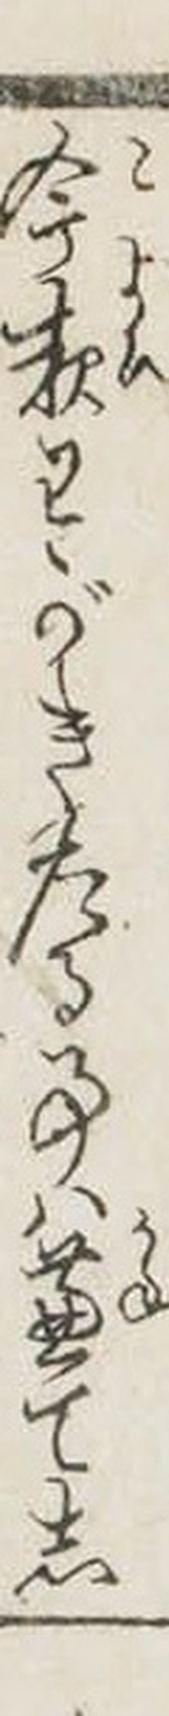今夜わがきたる事は兼てし
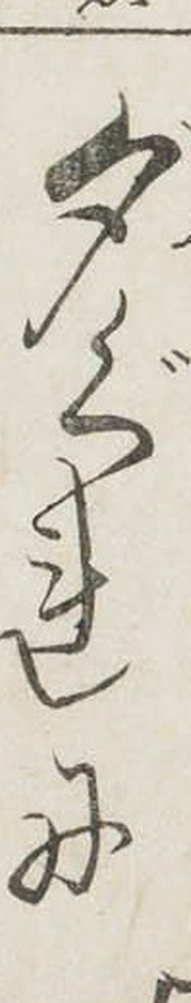夕ぐれに
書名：源氏百人一首
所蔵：東京学芸大学教育コンテンツアーカイブ
